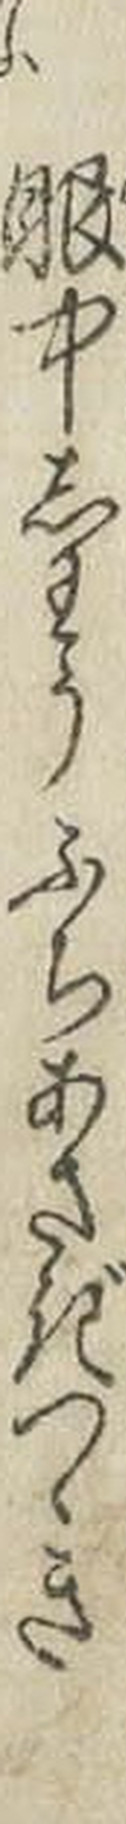眼中しわうふちあさぎつゝき
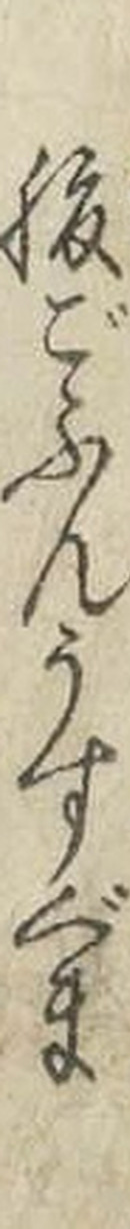腹ごふんうすぐま
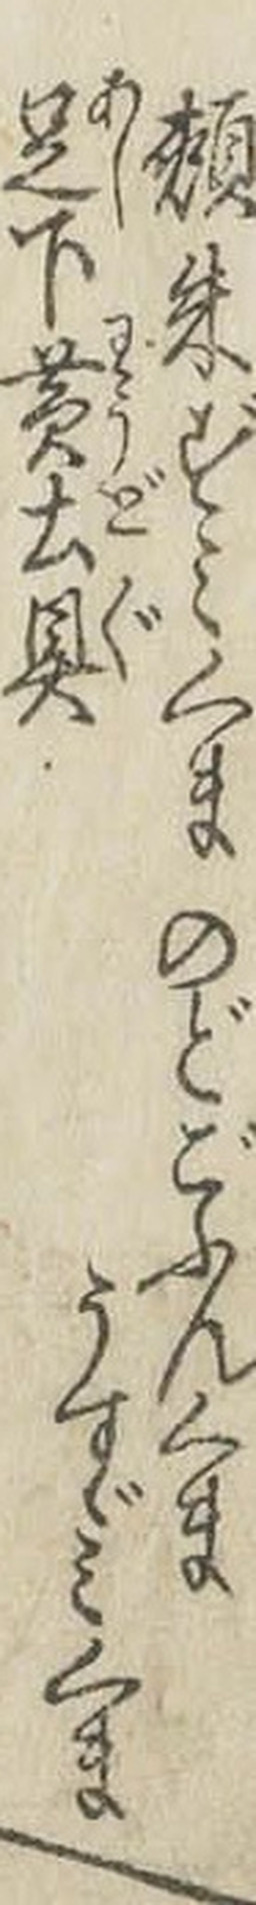足下黄土具うすゞみくま
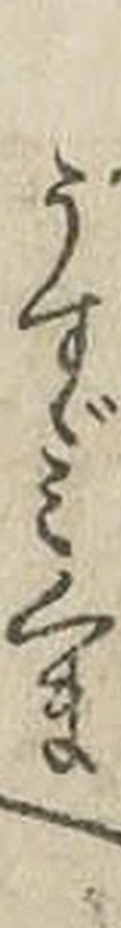うすゞみかくる
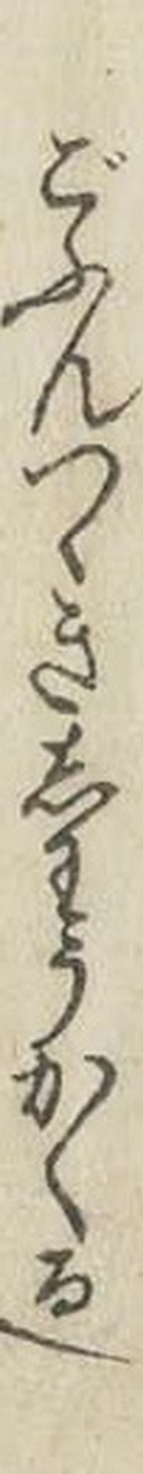ごふんつゝきしわうかくる
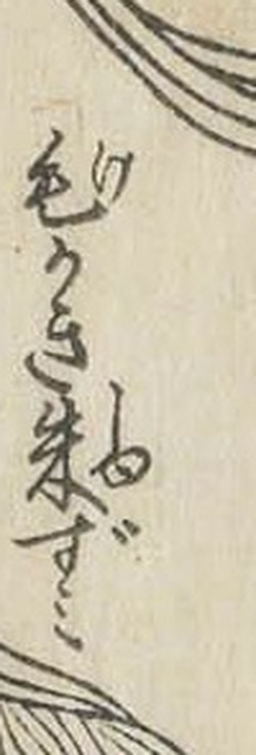毛かき朱ずみ
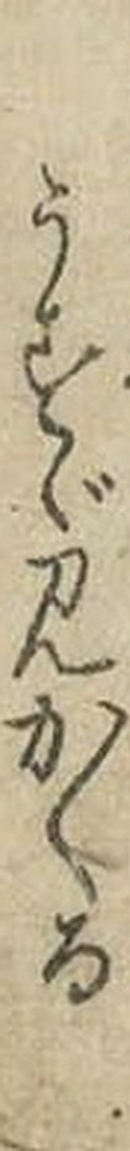うすゞみかくる

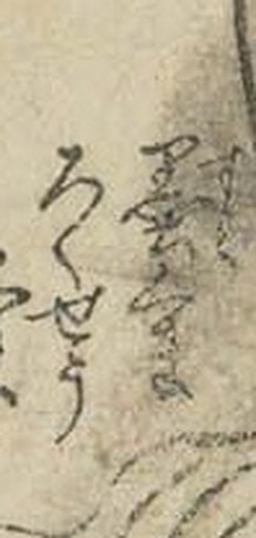ろくせう
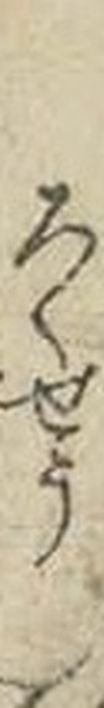ろくせう
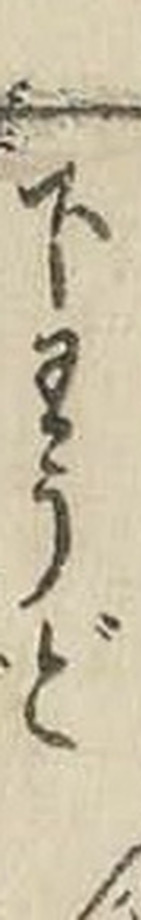下わうど
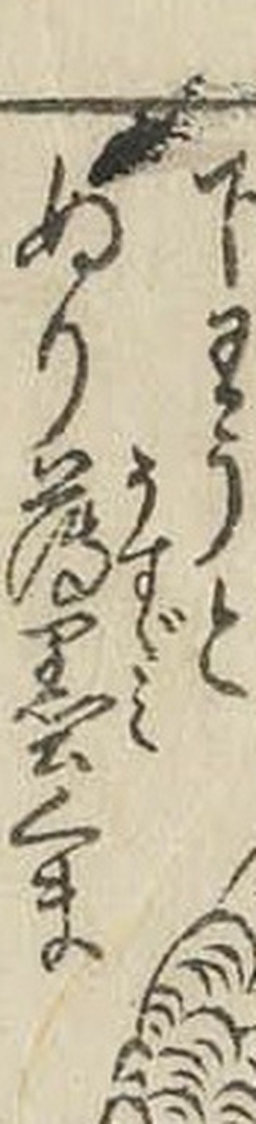ぬり薄墨くま
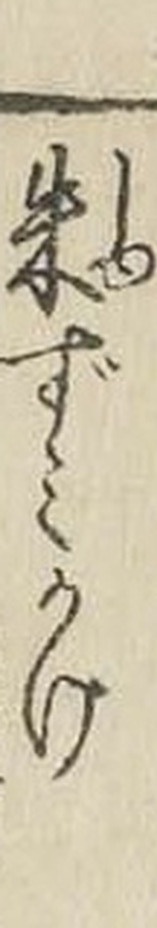朱ずみかけ
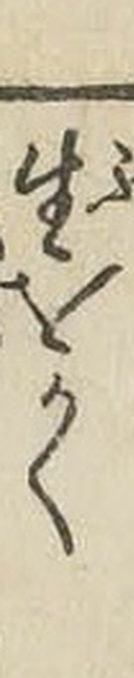生をかく
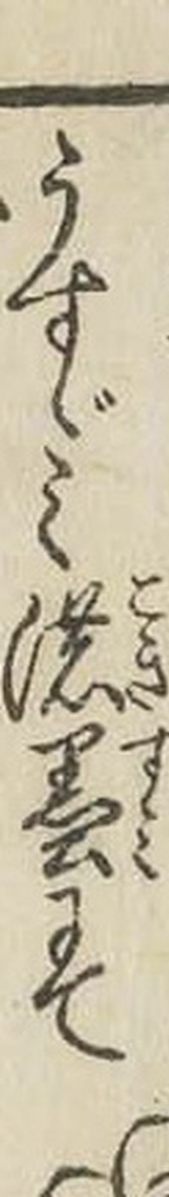うすゞみ濃墨にて
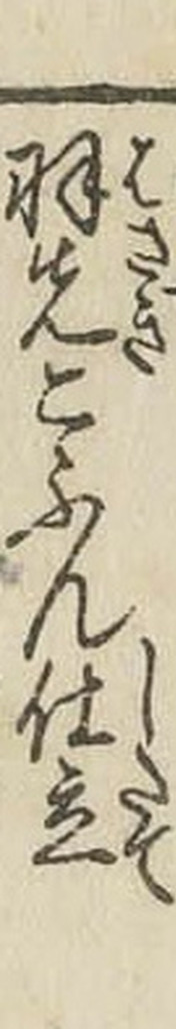羽先こふん仕立
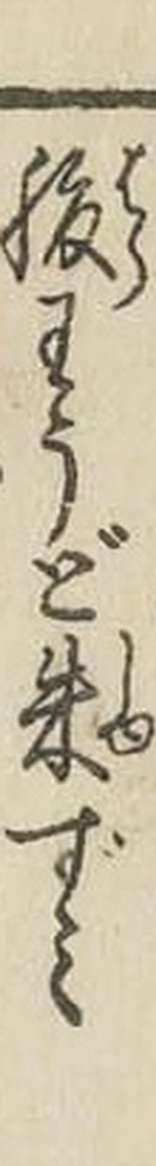腹わうど朱ずみ
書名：絵本写宝袋 9巻 8之巻
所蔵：東京学芸大学教育コンテンツアーカイブ
